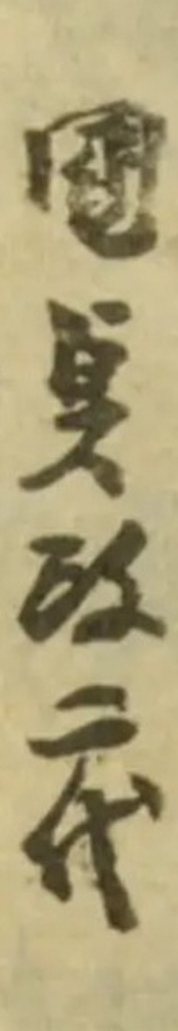国貞改二代
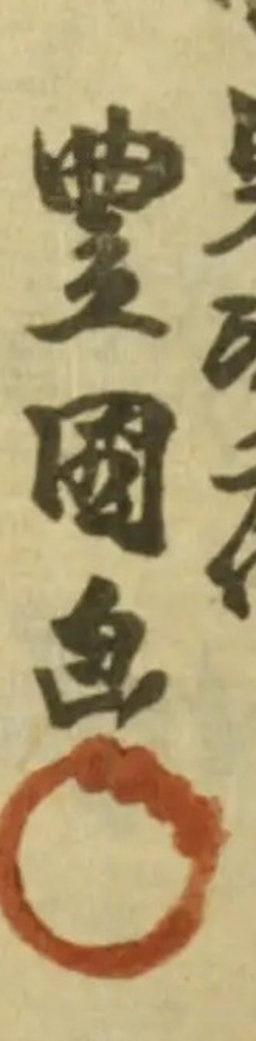豊国画
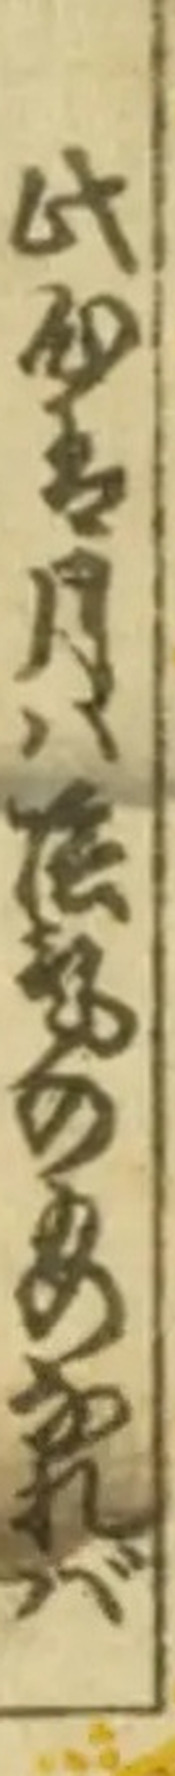此心は月は陰気のものなれば
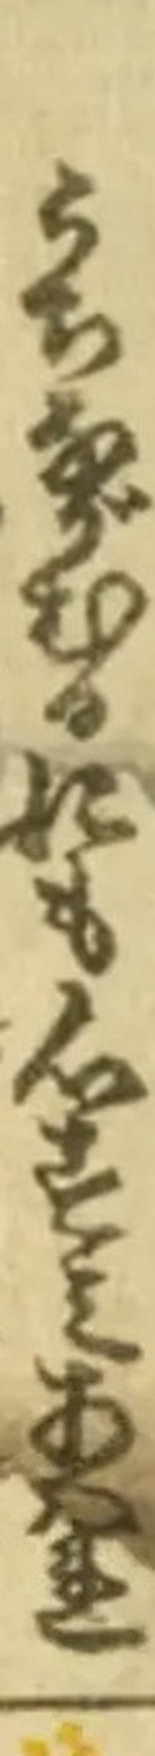うちながむるにも心すみあはれ
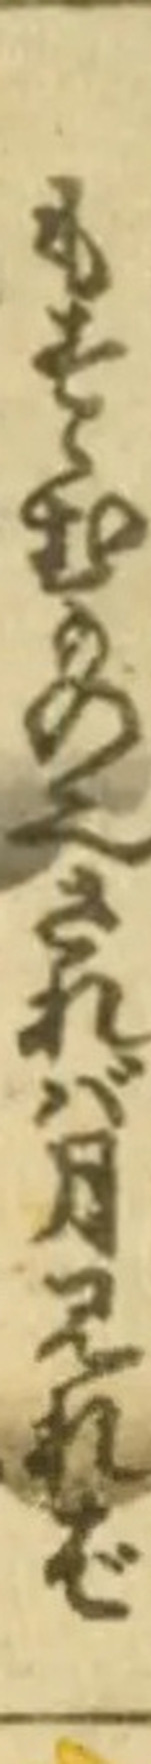もすゝむもの也されば月見れば
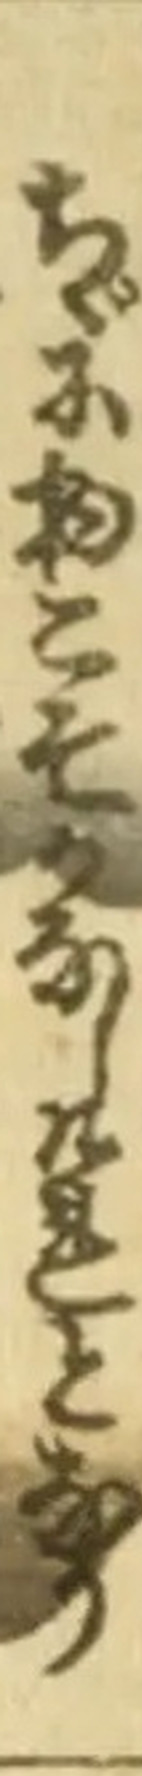ちゞに物こそかなしけれとなり
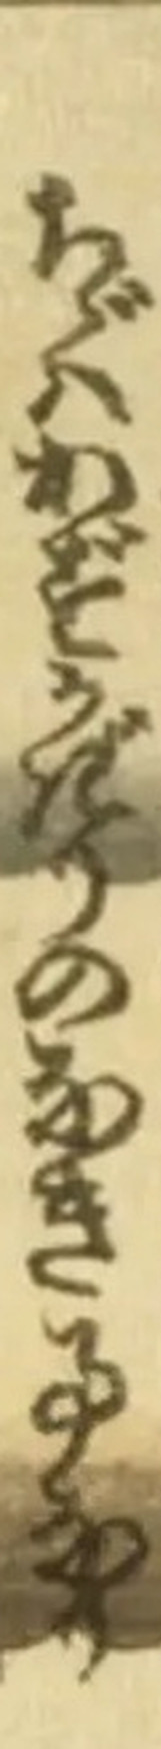ちゞはかずかぎりのなき事なり
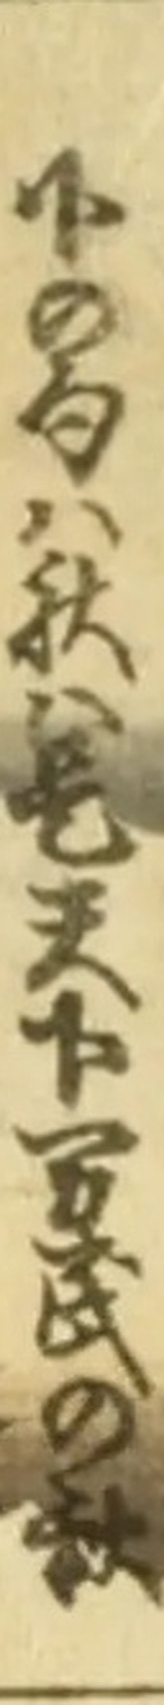下の句は秋は是天下万民の秋
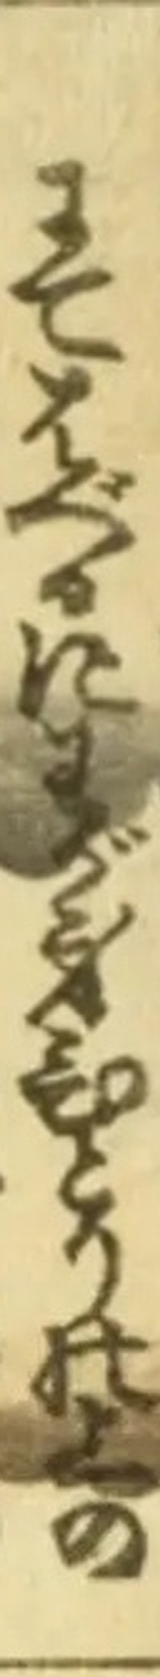にてはべるにわが身ひとりの上の
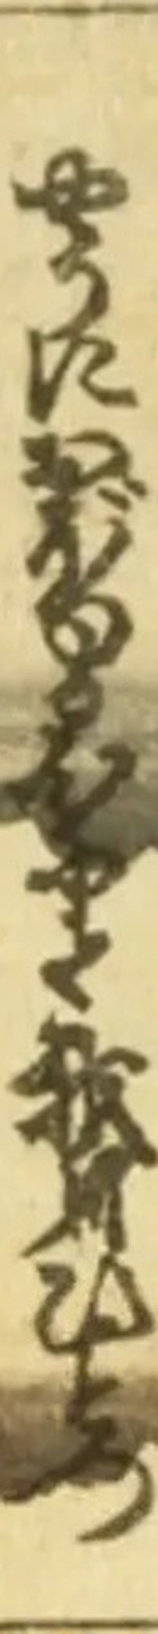やうにおぼゆる心にて我身ひとつ
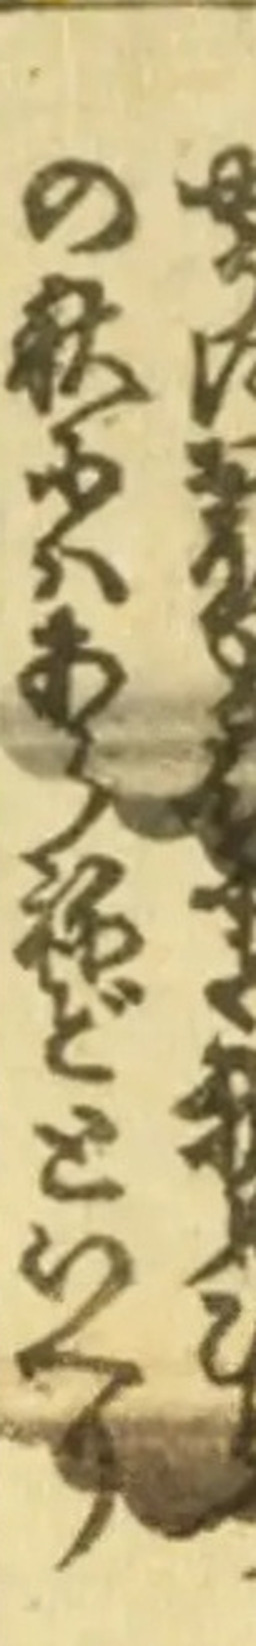の秋にはあらねどといへり
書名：百人一首絵抄　廿三　大江千里
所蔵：国立国会図書館 National Diet Library, JAPAN
